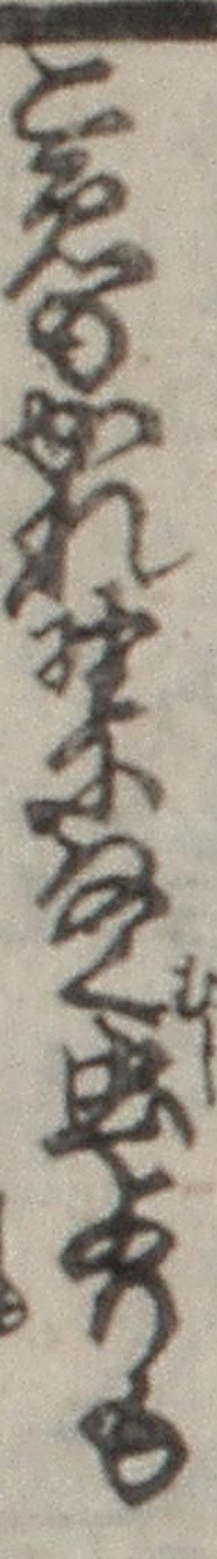こゑもかれ野になく虫よりも
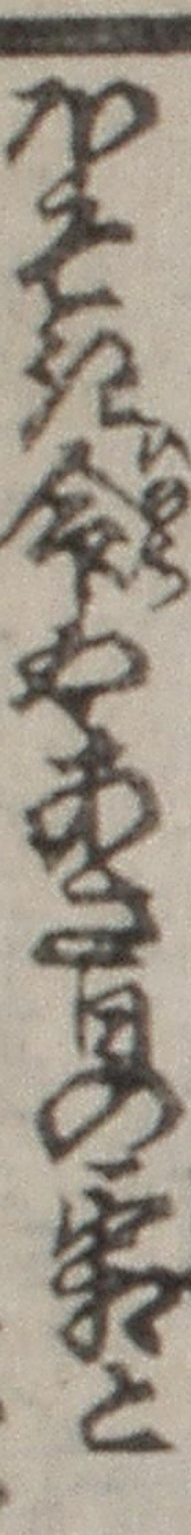ほそき命やあき日の霜と
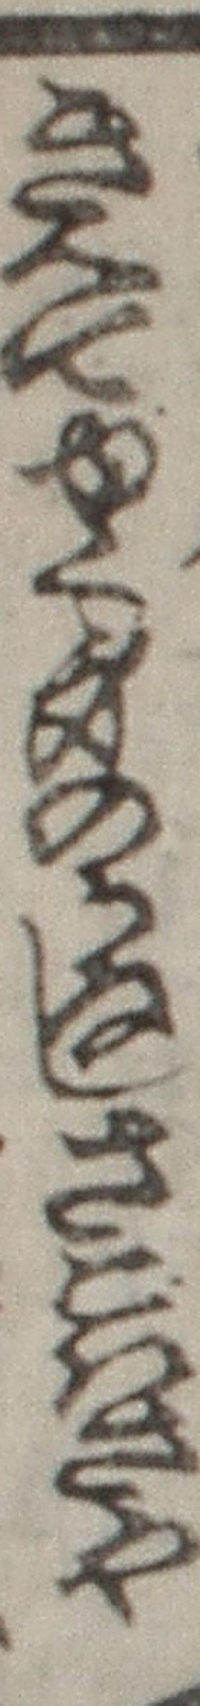きへてゆく身のかなしさこはさや

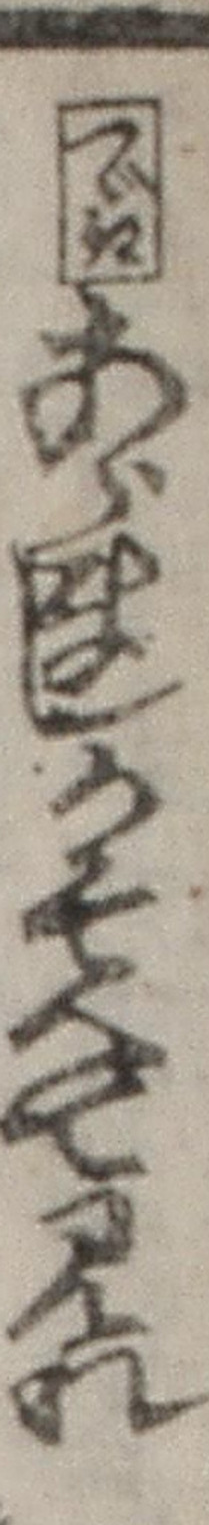つゞきあらましかそへてみれ
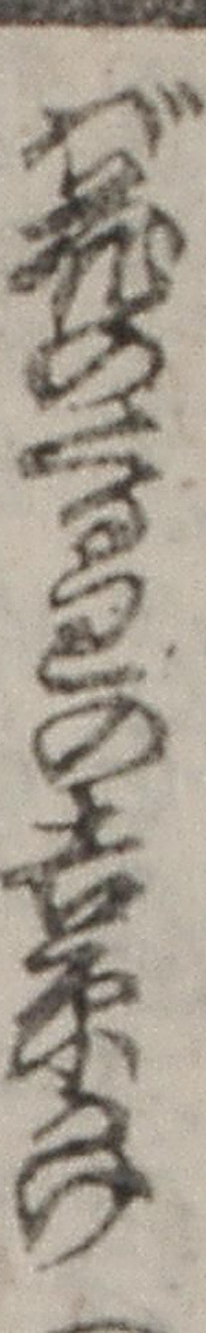は花のくるわの吉原かけ
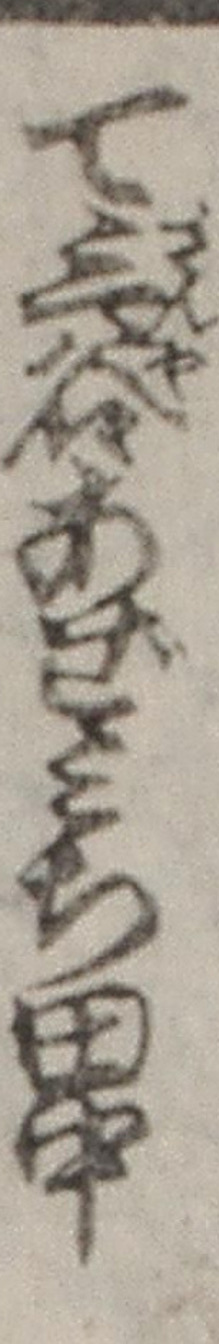て三谷あぜみち田中
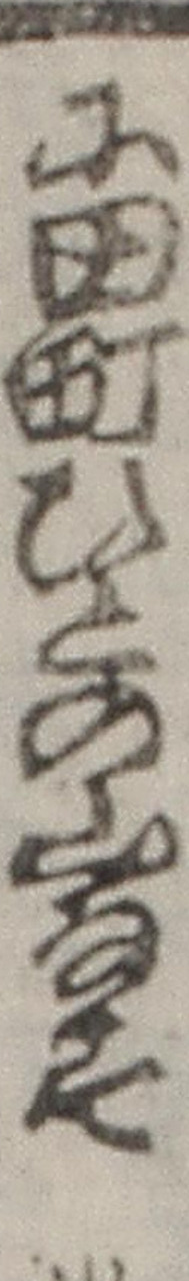に田町ひとの山なす
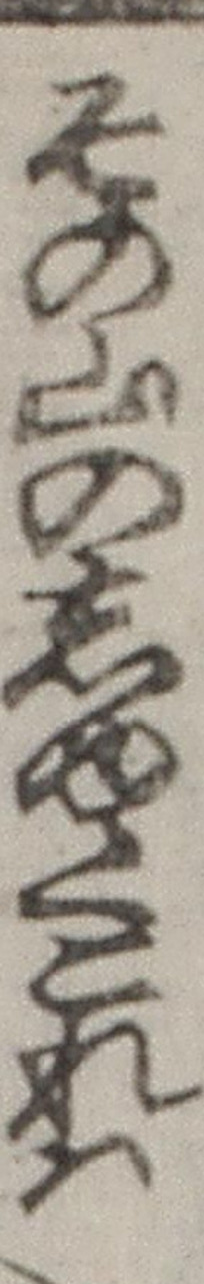その山のしゆくこれは
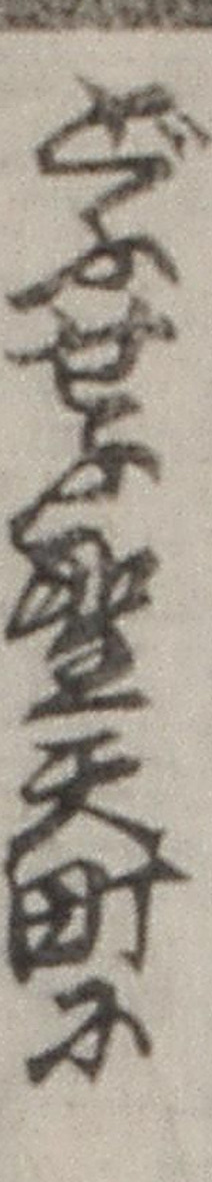どうせふ聖天町に
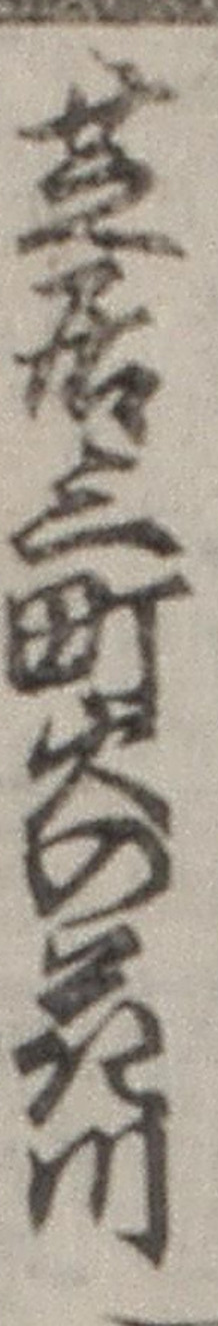芝居三町火の花川
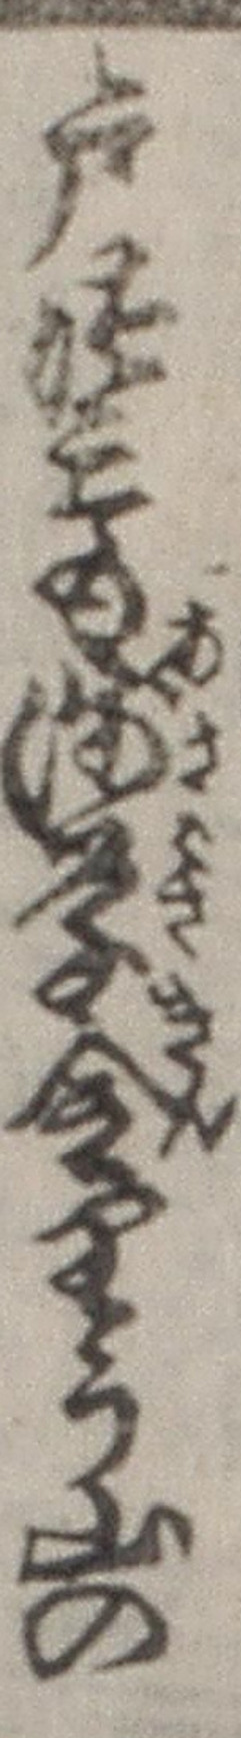戸かみも浅草金りう山の
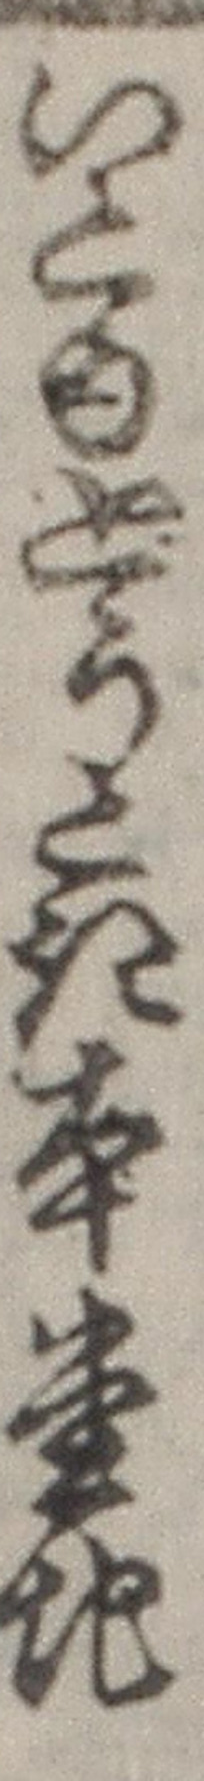いともとうとき本堂地
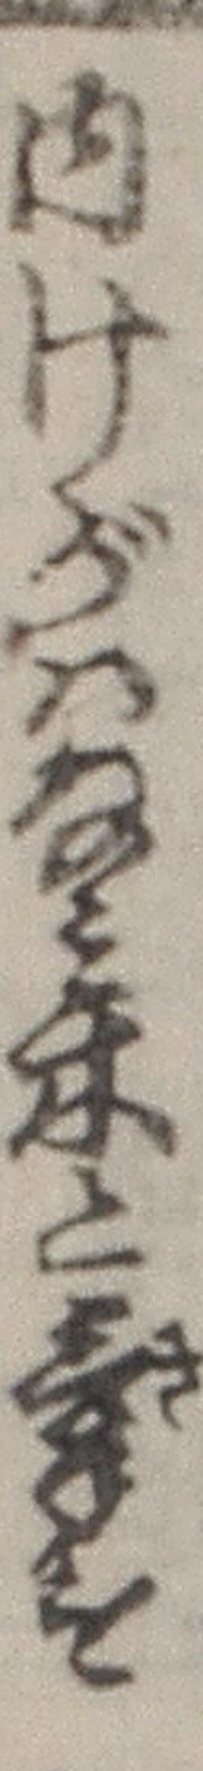内けがはなみ木と気を
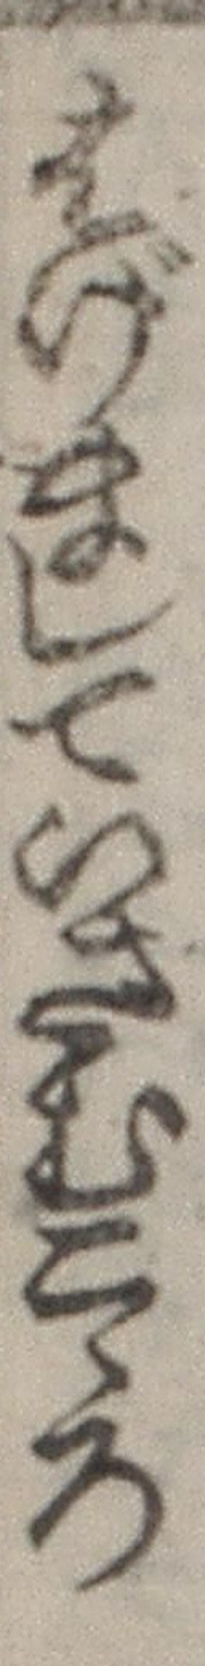はげましていさむこゝろ
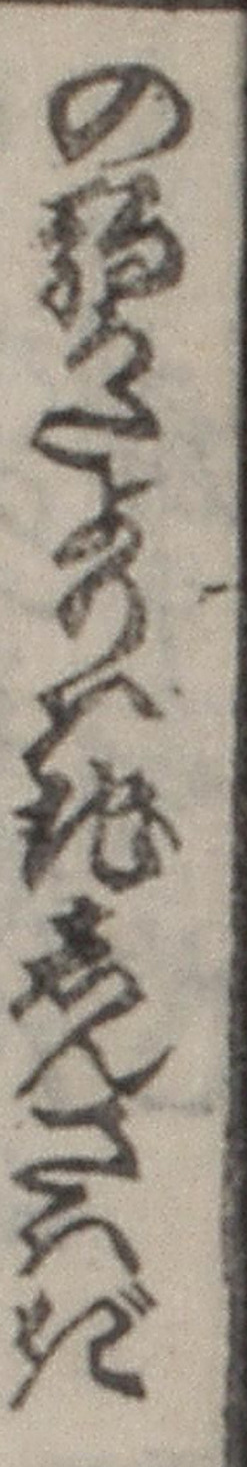の駒かたよりは地しんさはぎ
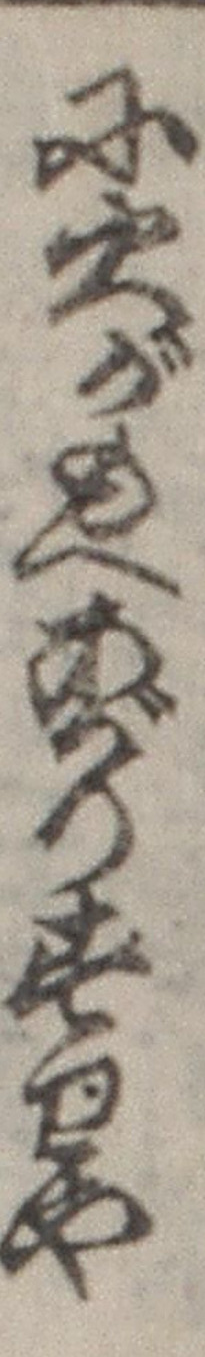に火がもへあがりすわや
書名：安政二卯年　江戸大地震并出火附
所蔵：東京大学地震研究所図書室 Earthquake Research Institute Library, The University of Tokyo, JAPAN
